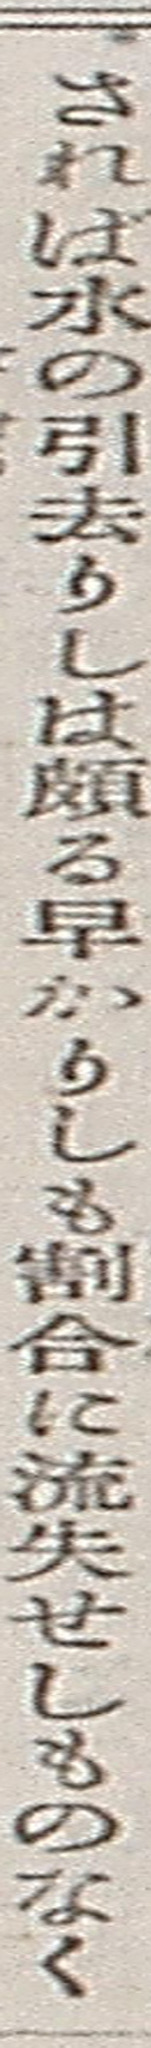されば水の引去りしは頗る早かりしも割合に流失せしものなく
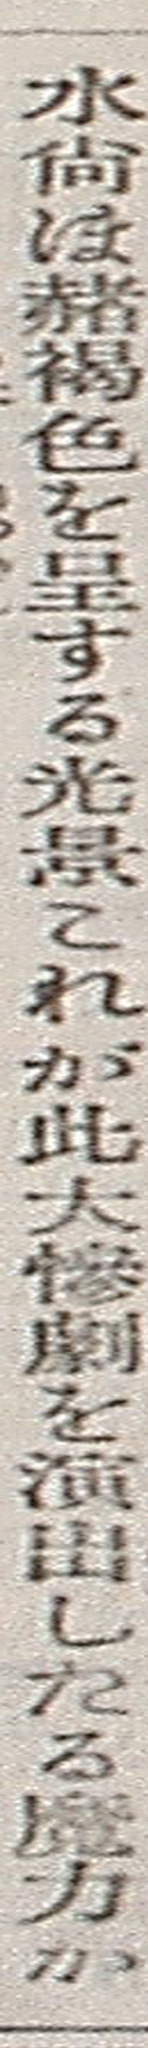水尚ほ赭褐色を呈する光景これが此大惨劇を演出したる魔力か
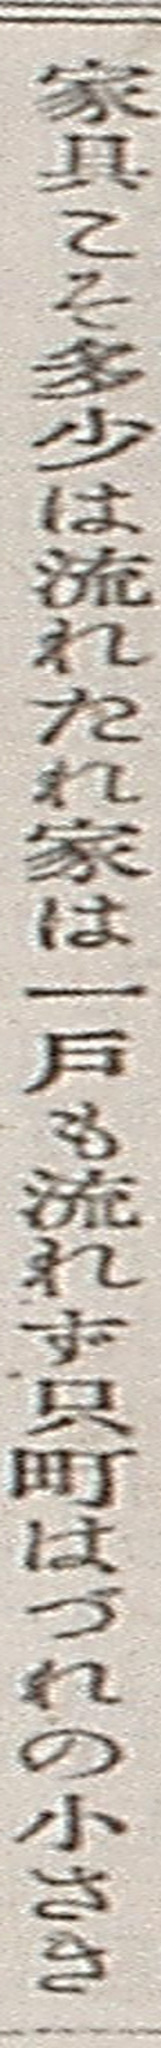家具こそ多少は流たる家は一戸も流れず只町はづれの小さき
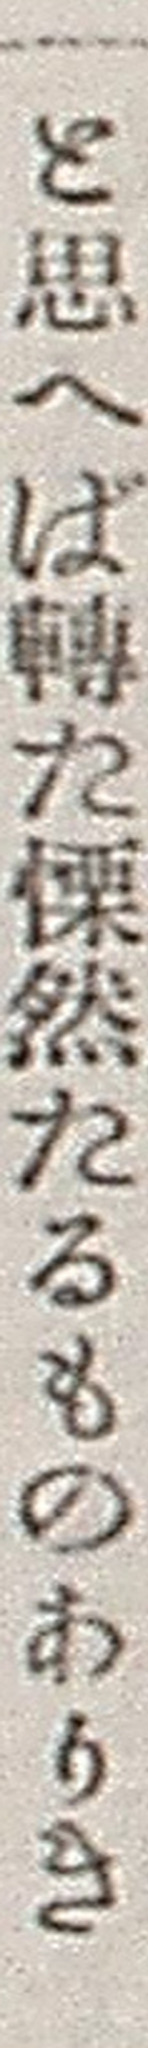と思へば転た慄然たるものありき

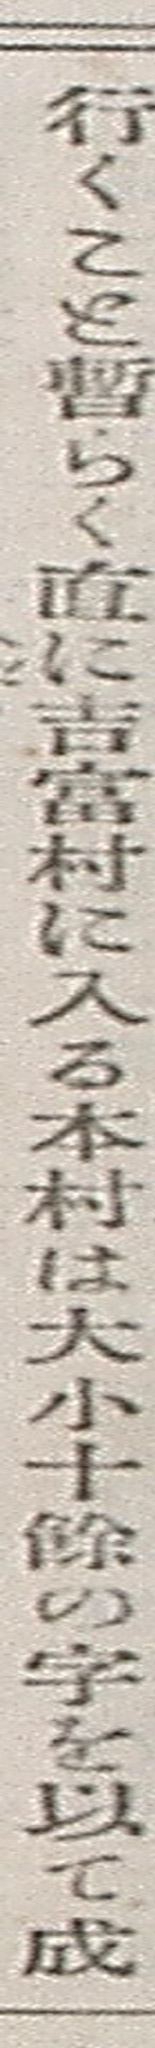行くこと暫らく直に吉富村に入る本村は大小十餘の字を以て成
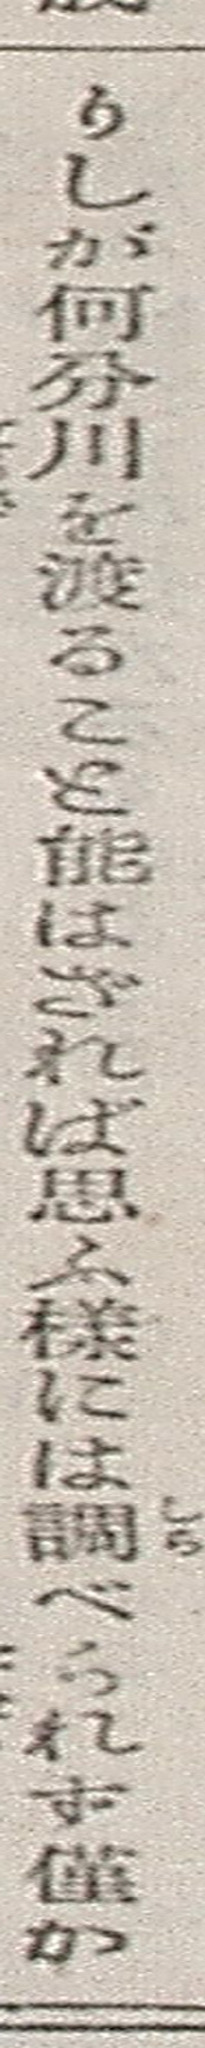りしが何分川を渡ること能はざれば想ふ様に調べられず僅か
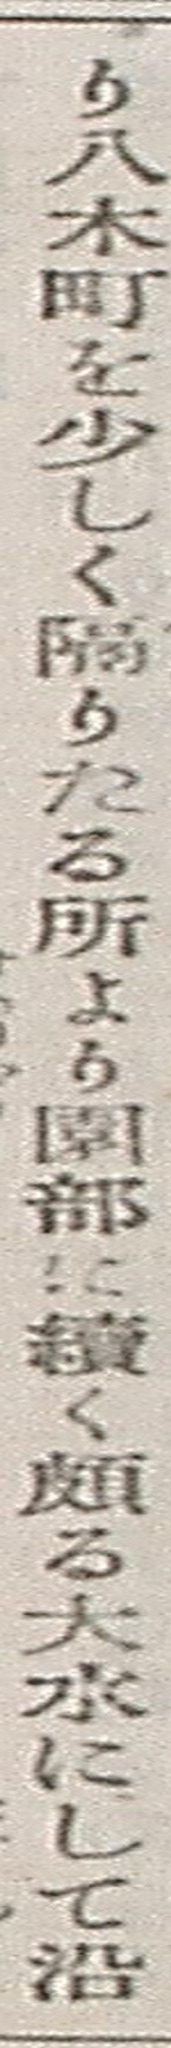り八木町を少しく隔りたる所より園部に続く頗る大水にして沿
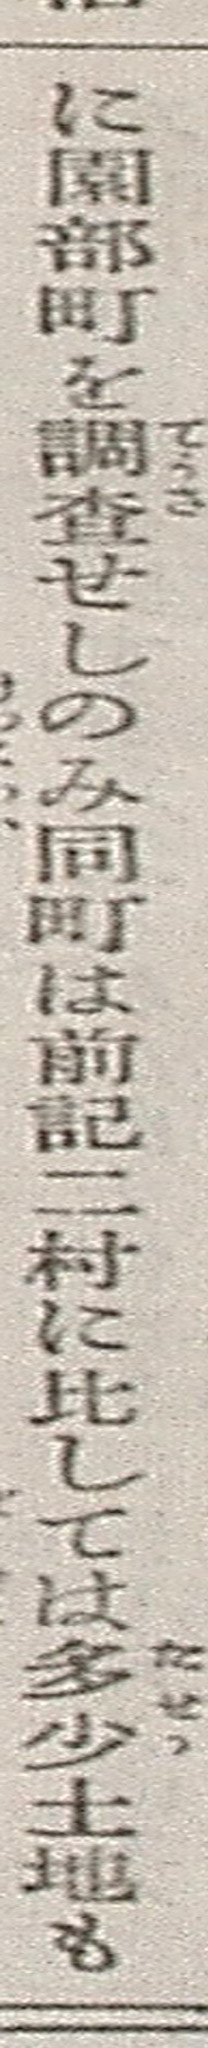園部町を調査せしのみ同町は前記二村に比しては多少土地も
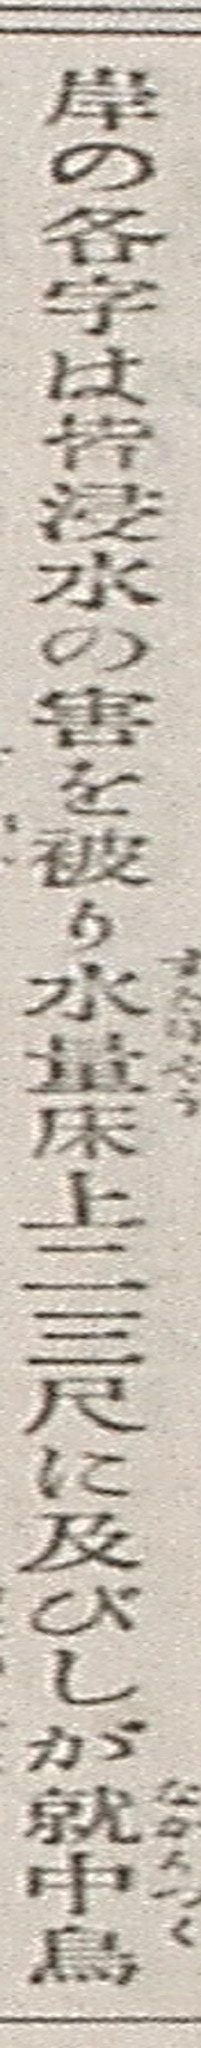岸の各字は皆浸水の害を被り水量床上二三尺に及びしが就中鳥
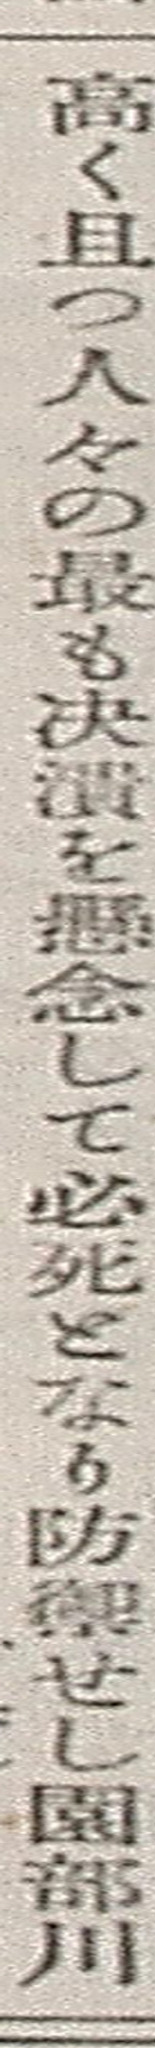高く且つ人々の最も决潰を懸念して必死となり防禦せし園部川
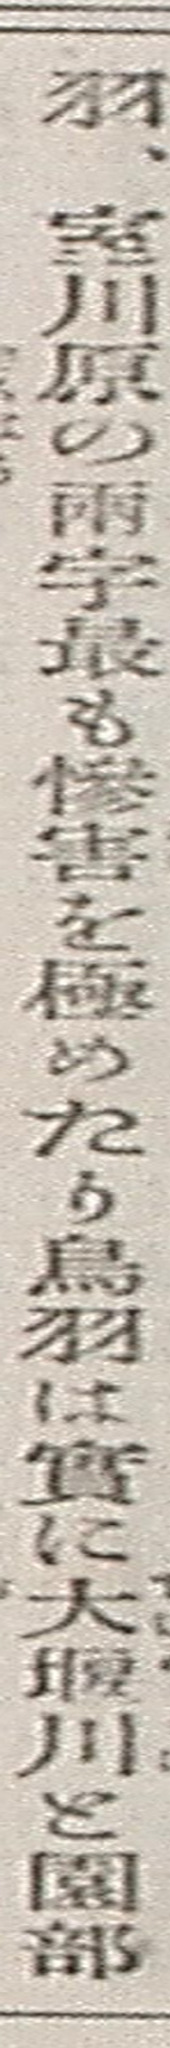羽、室川原の両字最も惨害を極めたり鳥羽は実に大堰川と園部
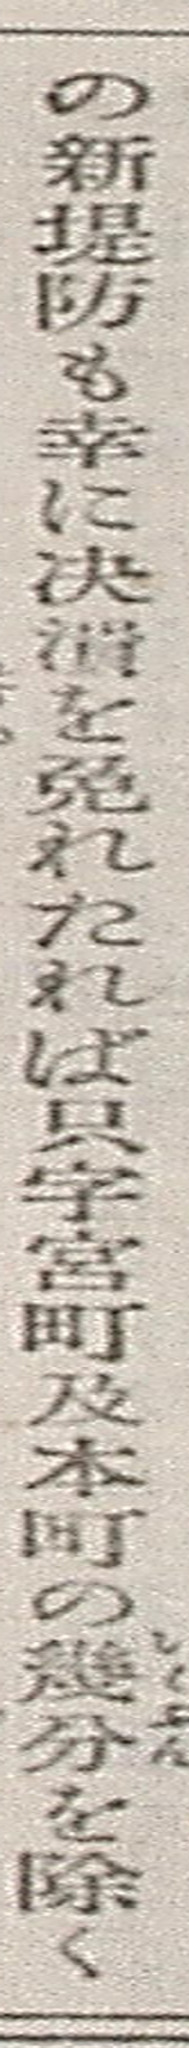の新堤防幸に决潰を免れたれば只字宮町及本町の幾分を除く
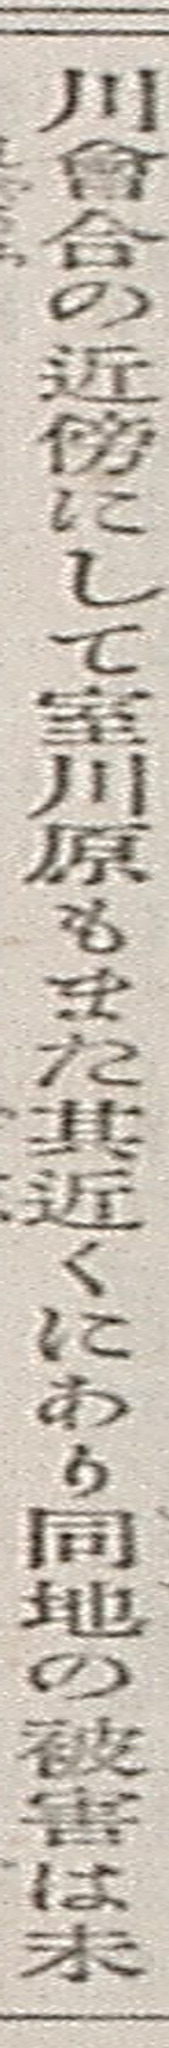川会合の近傍にして室川原もまた其近くにあり同地の被害は未
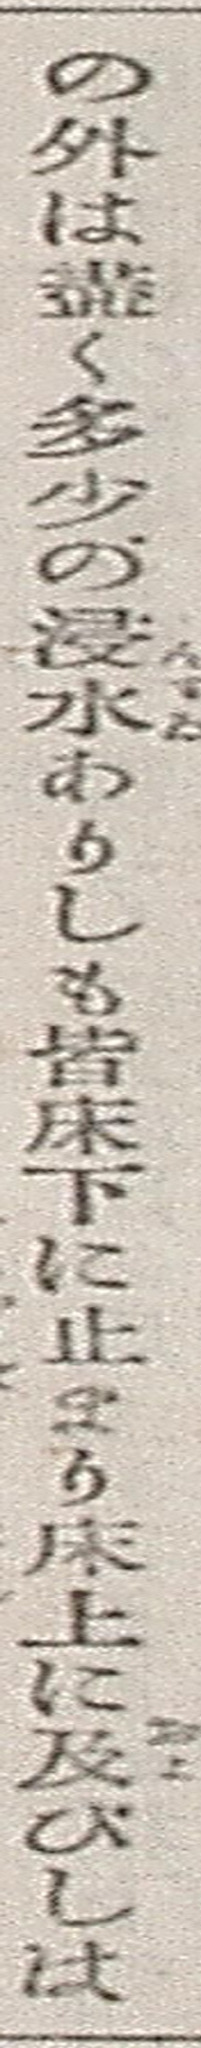の外は悉く多少の浸水ありしも皆床下に止まり床上に及びしは
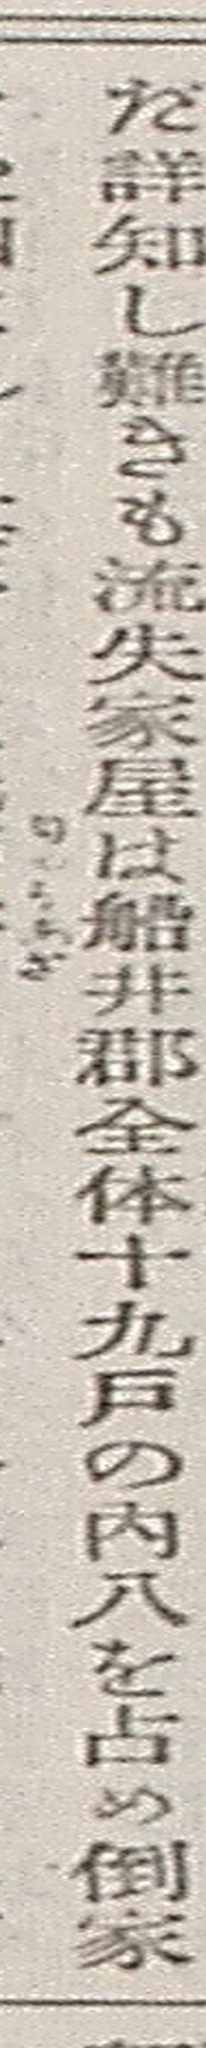だ詳知し難きも流失家屋は船井郡全体十九戸の内八を占め倒家
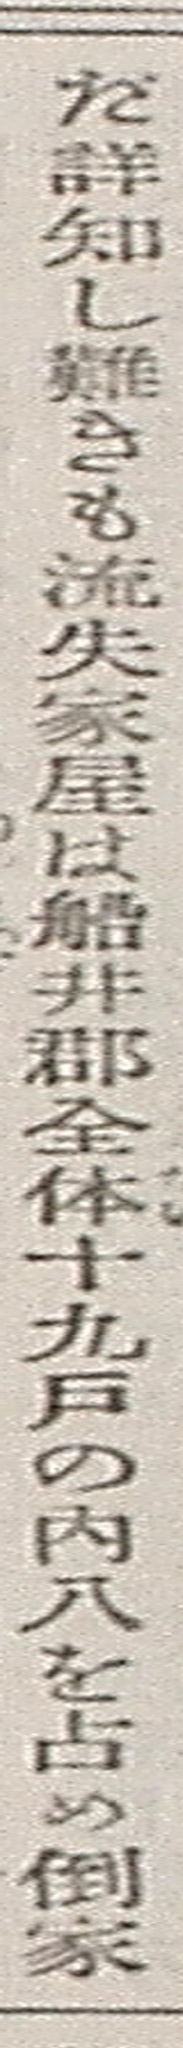だ詳知し難きも流失家屋は船井郡全体十九戸の内八を占め倒家
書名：風俗畫報臨時増刊第百二十六號　洪水被害録（中）
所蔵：東京大学地震研究所図書室 Earthquake Research Institute Library, The University of Tokyo, JAPAN
